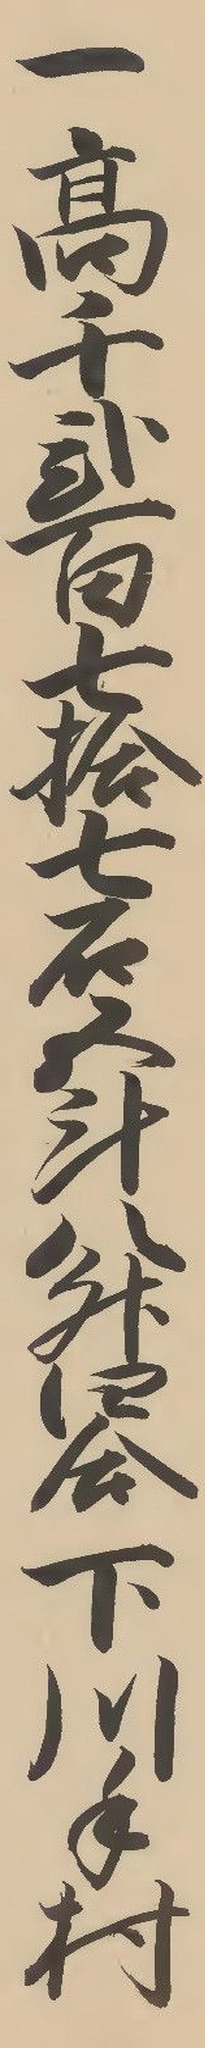一高千弐百七拾七石五斗八升四合下川手村
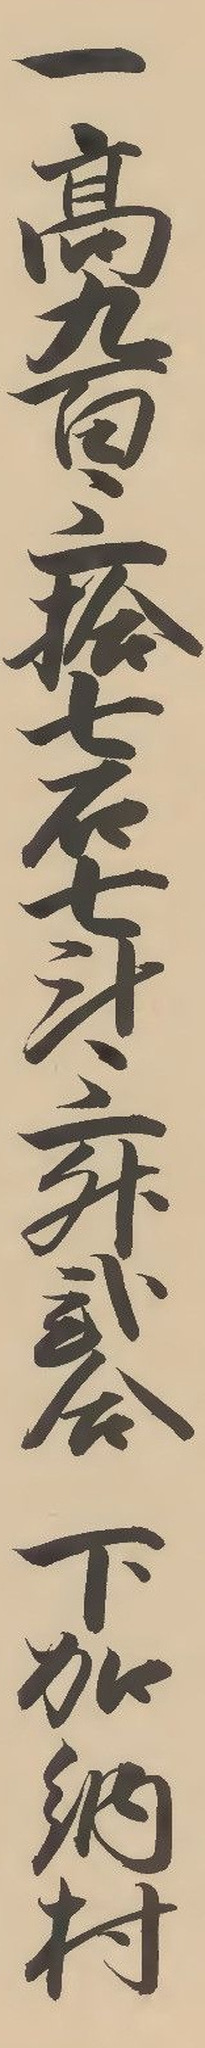一高九百三拾七石七斗三升弐合下加納村
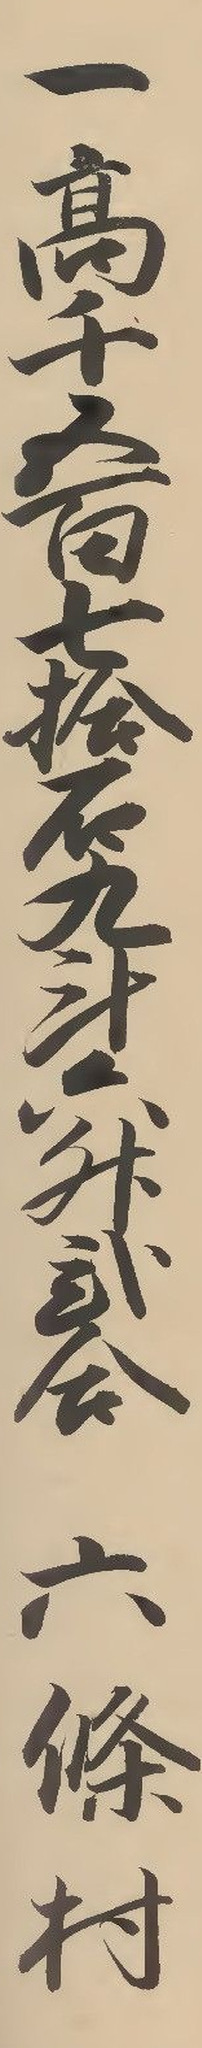一高千五百七拾石九斗六升弐合六条村
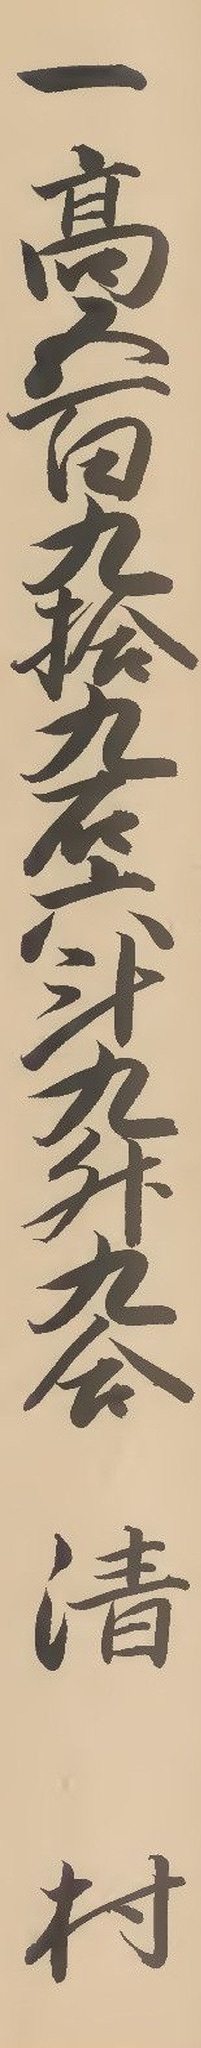一高五百九拾九石六斗九升九合清村
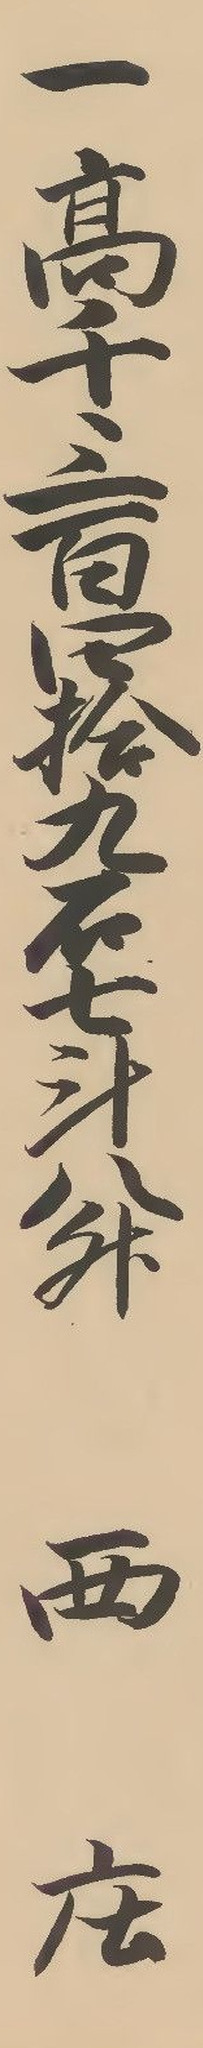一高千三百四拾九石七斗八升西庄

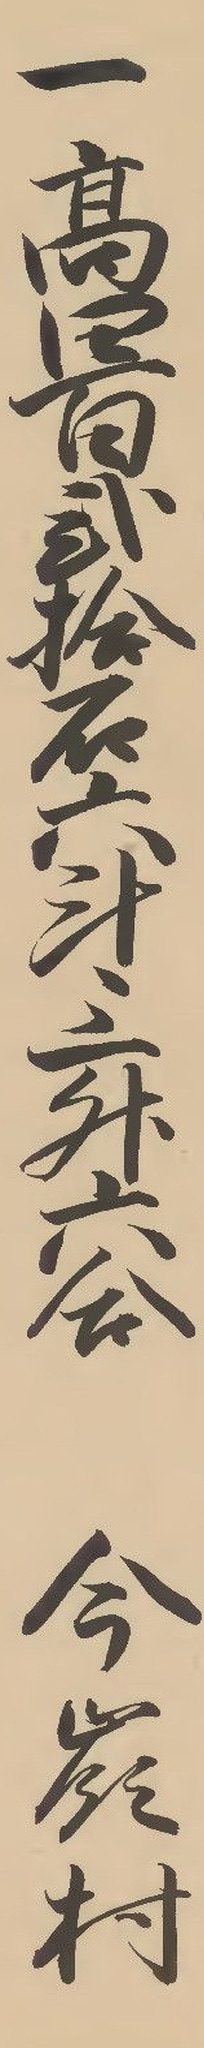一高四百弐拾石六斗三升六合今嶺村
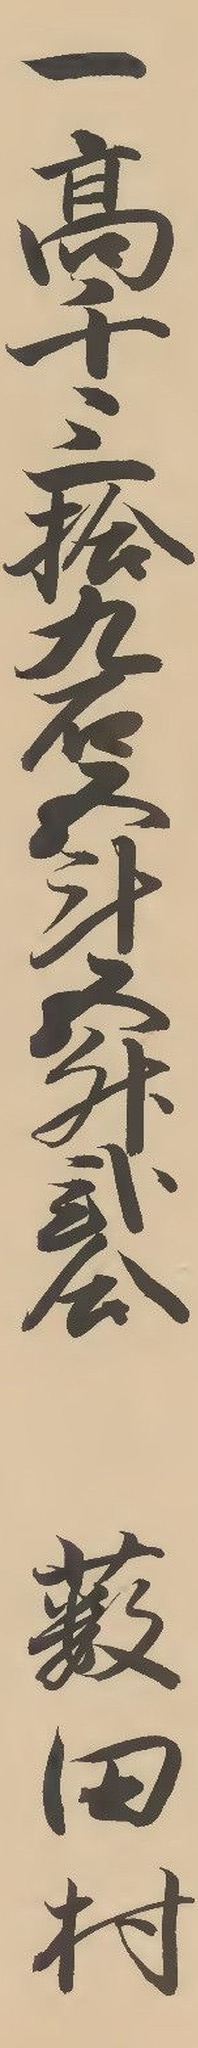一高千三拾九石五斗五升弐合薮田村
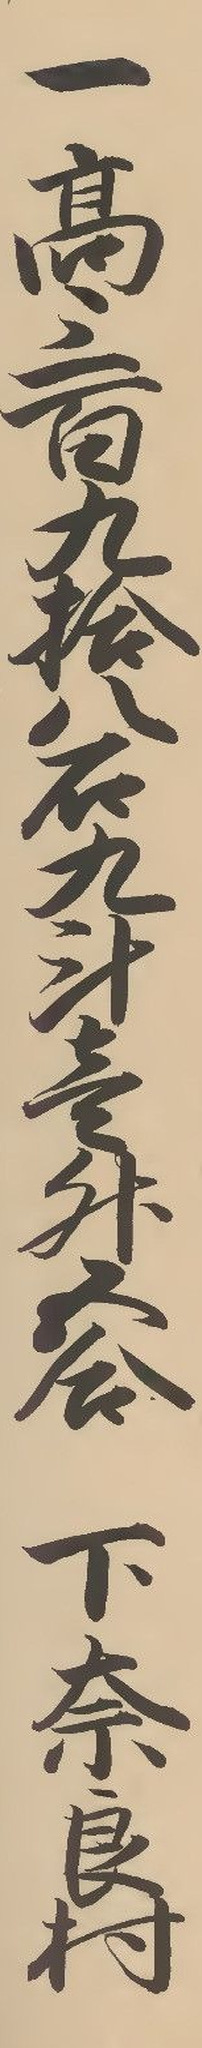一高三百九拾八石九斗壱升五合下奈良村
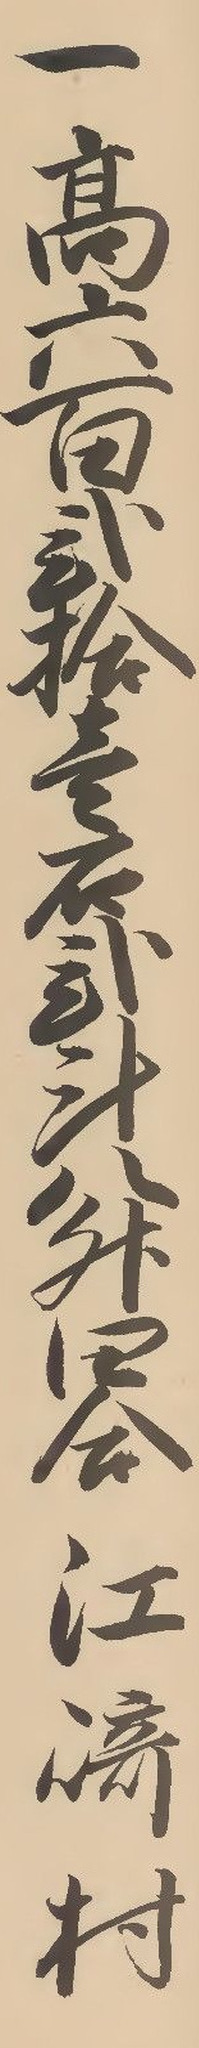一高六百弐拾壱石弐斗八升四合江崎村
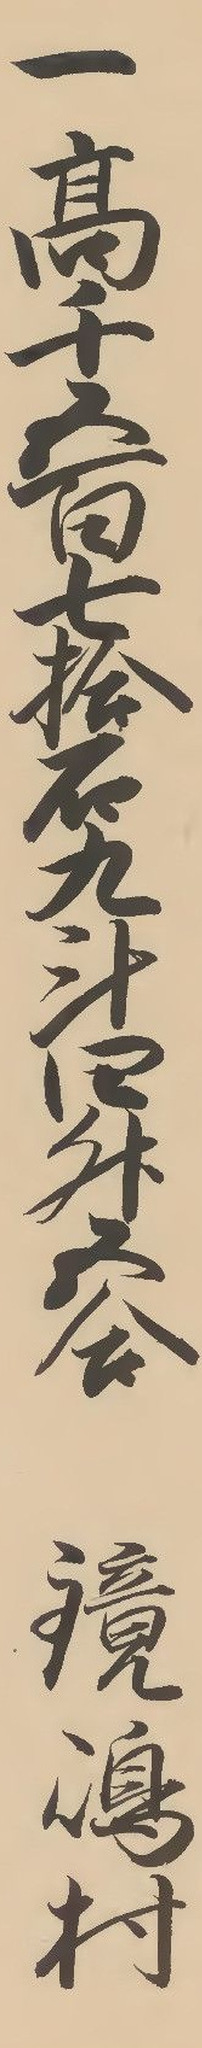一高千五百七拾石九斗四升五合鏡島村
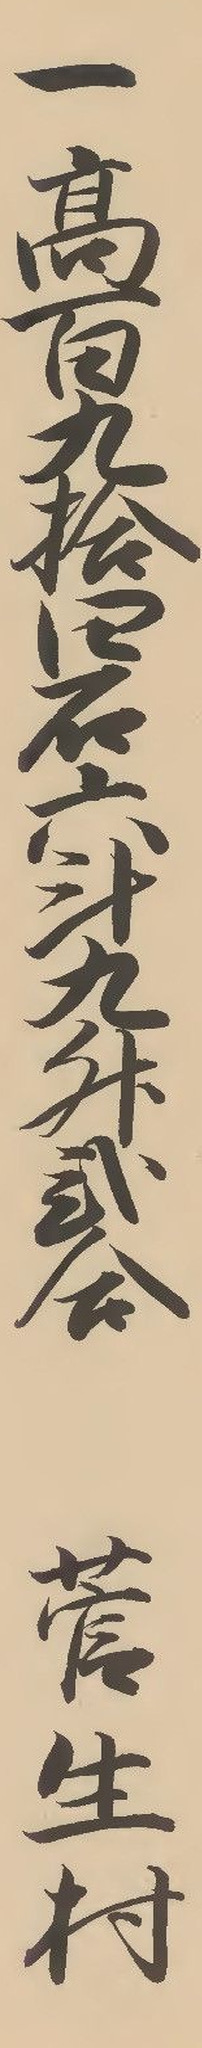一高百九拾四石六斗九升弐合菅生村
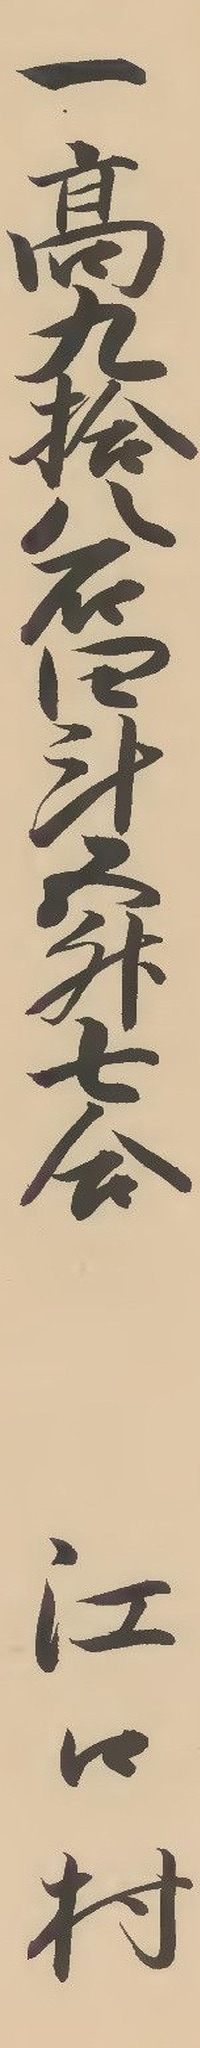一高九拾八石四斗五升七合江口村

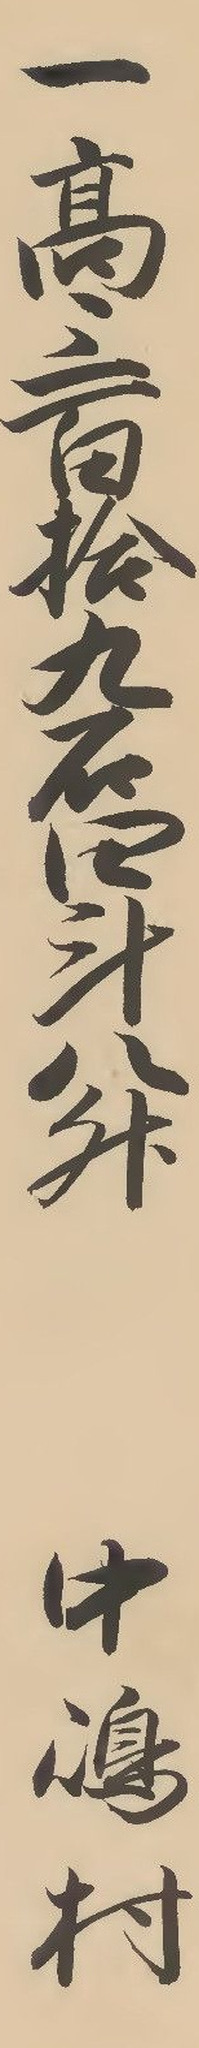一高三百拾九石四斗八升中島村
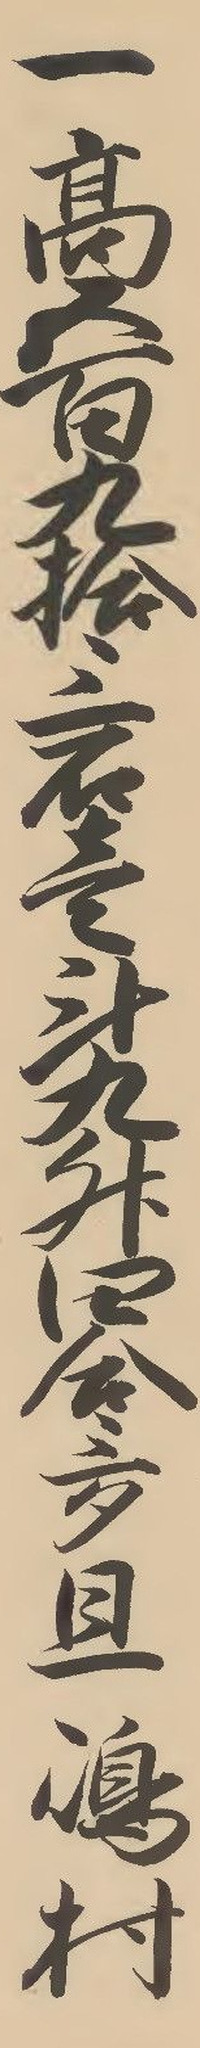一高五百九拾三石壱斗九升四合三勺旦島村
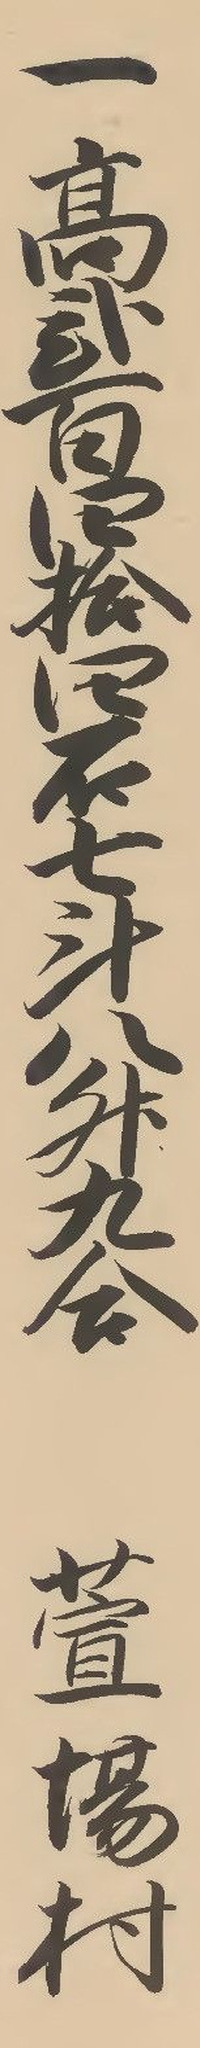一高弐百四拾四石七斗八升九合萱場村
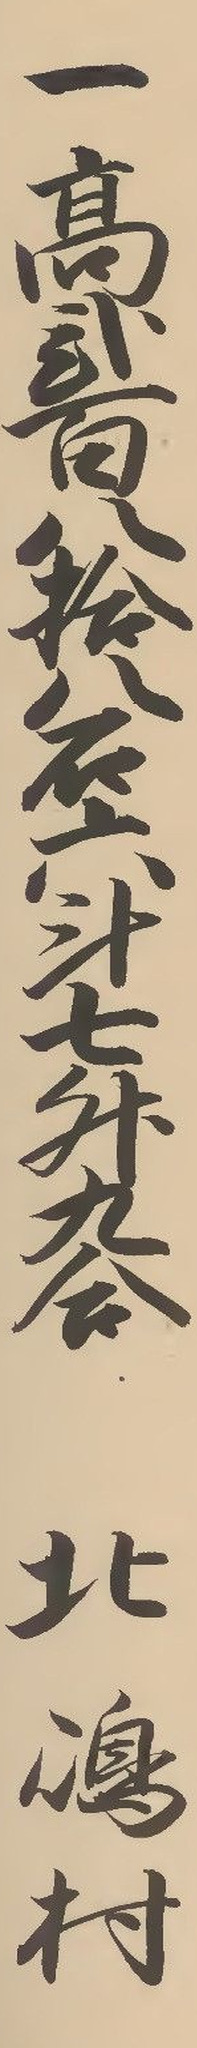一高弐百八拾八石六斗七升九合北島村
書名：美濃国郷帳
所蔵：国立公文書館 National Archives of Japan
